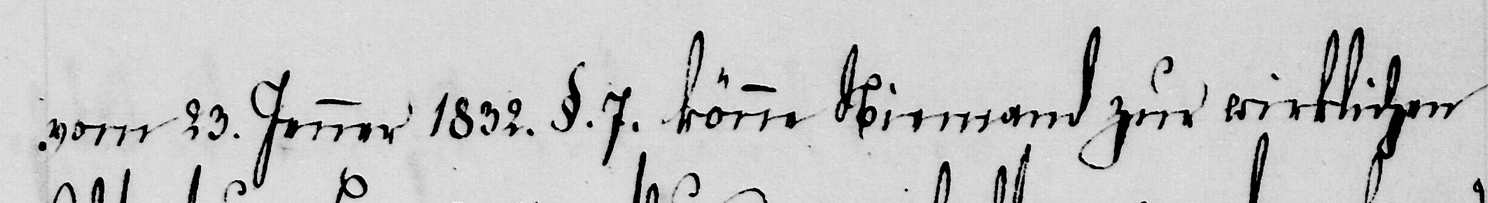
vom 23. Jenner 1832. §. 7. könne Niemand zur wirklichen
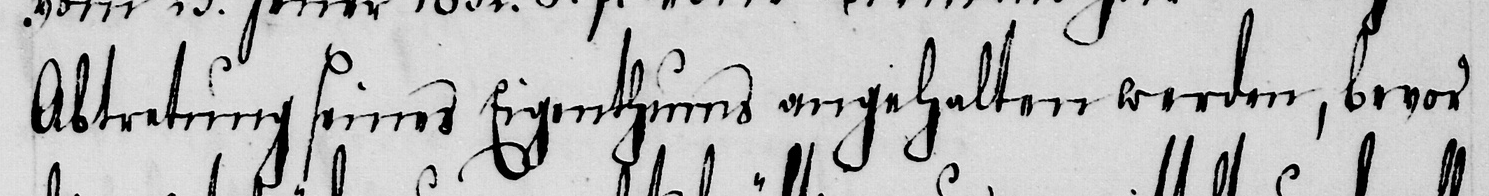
Abtretung seines Eigenthums angehalten werden, bevor
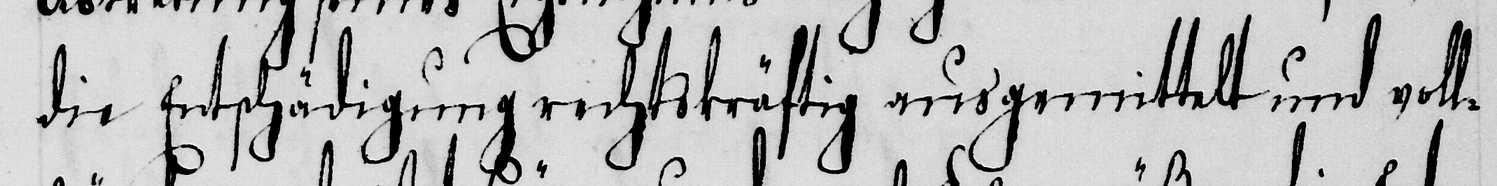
die Entschädigung rechtskräftig ausgemittelt und vol¬
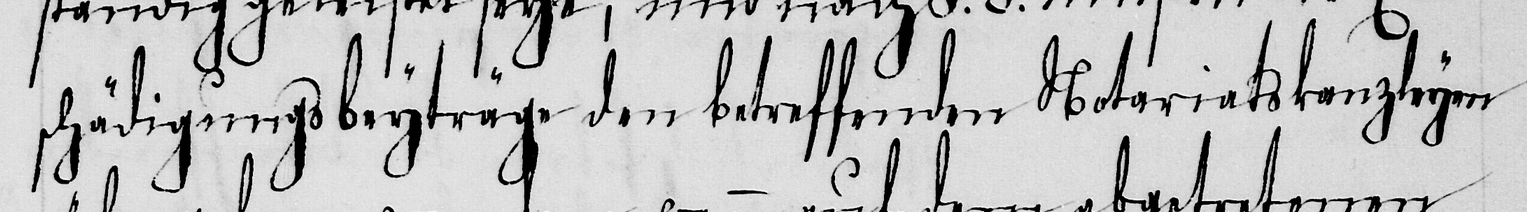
chädigungsbeyträge den betreffenden Notariatskanzleyen
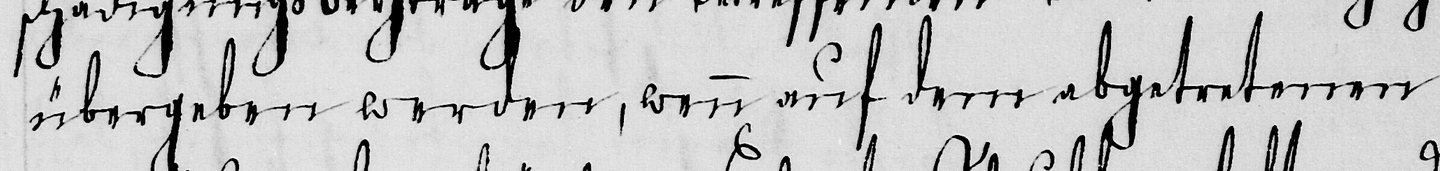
übergeben werden, wenn auf dem abgetretenen
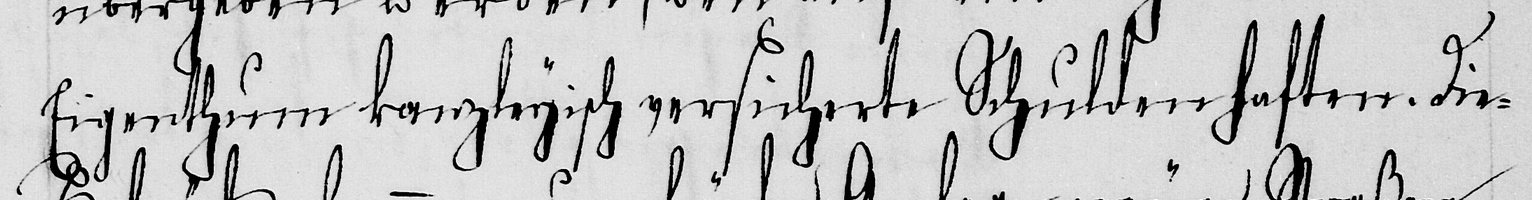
Eigenthum kanzleyisch versicherte Schulden haften. Die¬
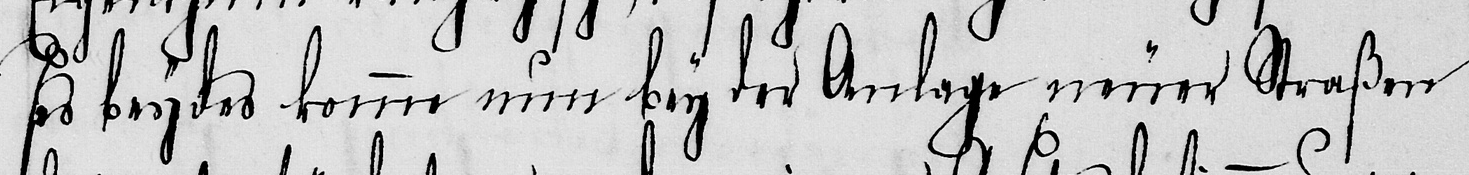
ses beydes komme nun bey der Anlage neuer Straßen
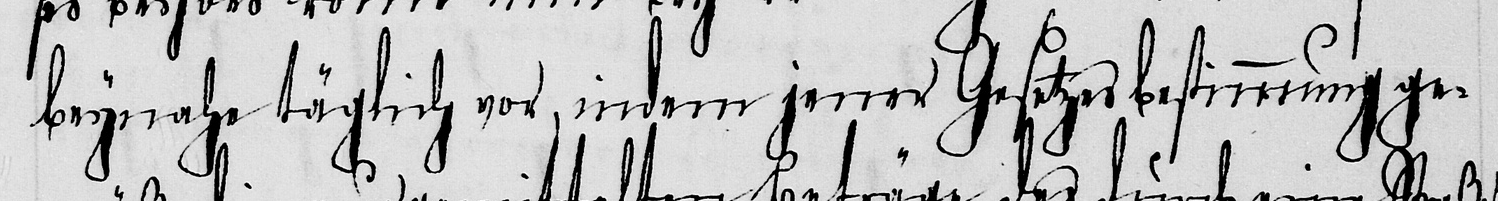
beynahe täglich vor, indem jener Gesetzesbestimmung ge¬
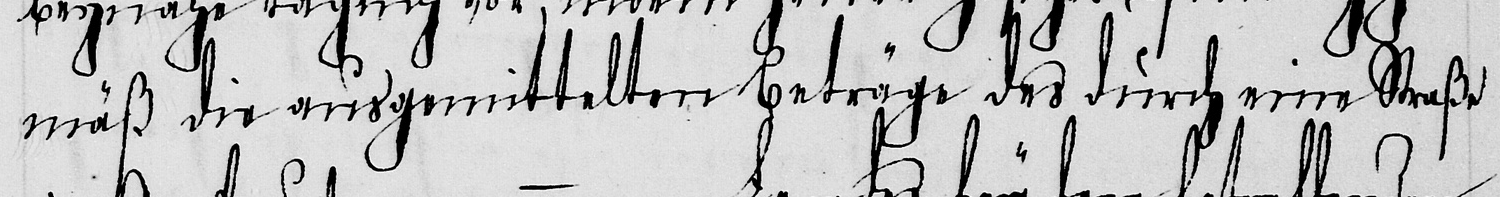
mäß die ausgemittelten Beträge des durch eine Straße
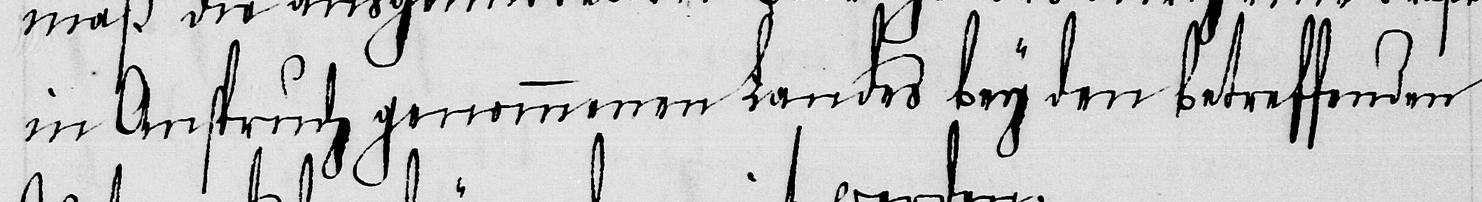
in Anspruch genommenen Landes bey den betreffenden
